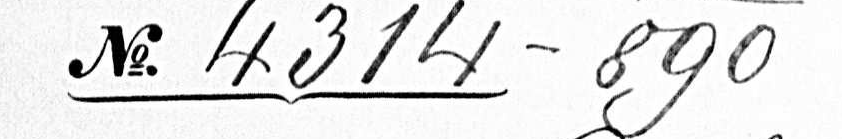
No. 4314 - 890
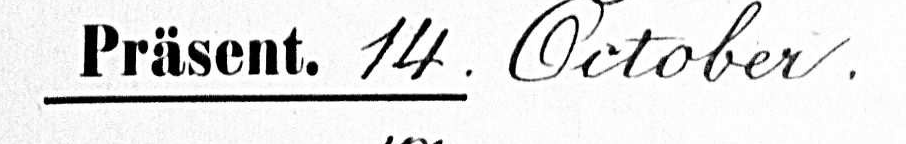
Präsent. 14. October.
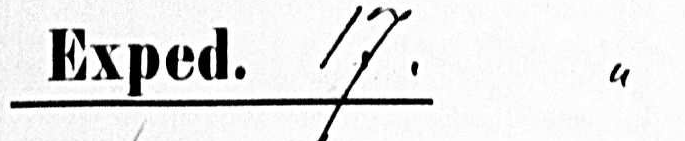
Exped. 17. October.
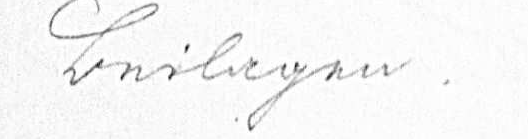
Beilagen
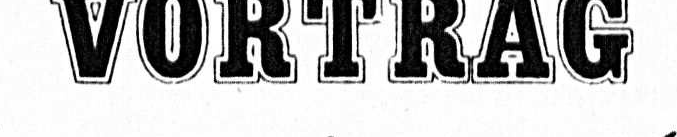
VORTRAG
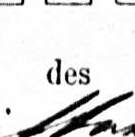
des
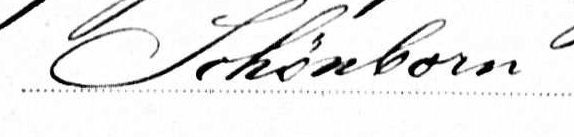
Schönborn
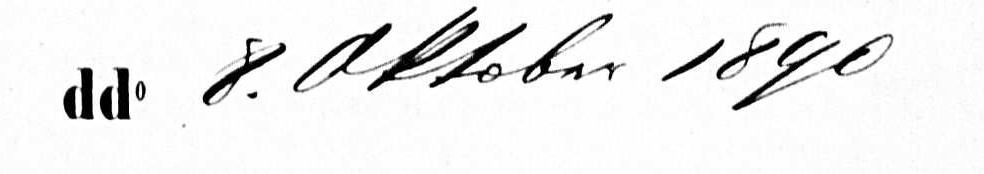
ddo8. Oktober 1890
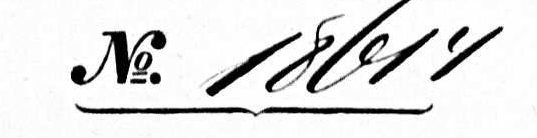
No. 18614
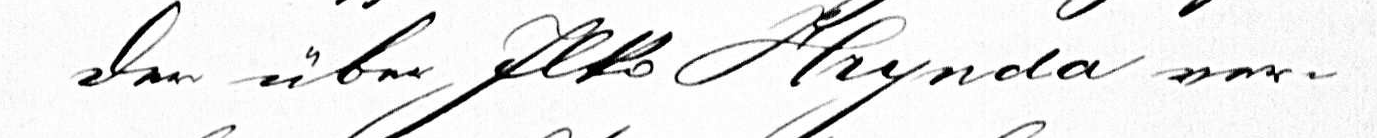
der über Jlko Hrynda ver¬
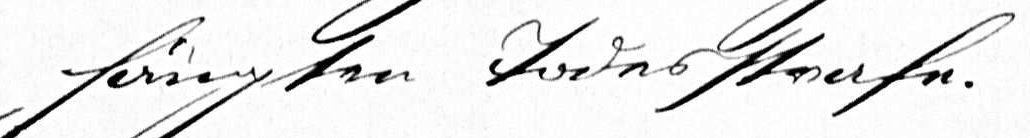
hängten Todesstrafe.
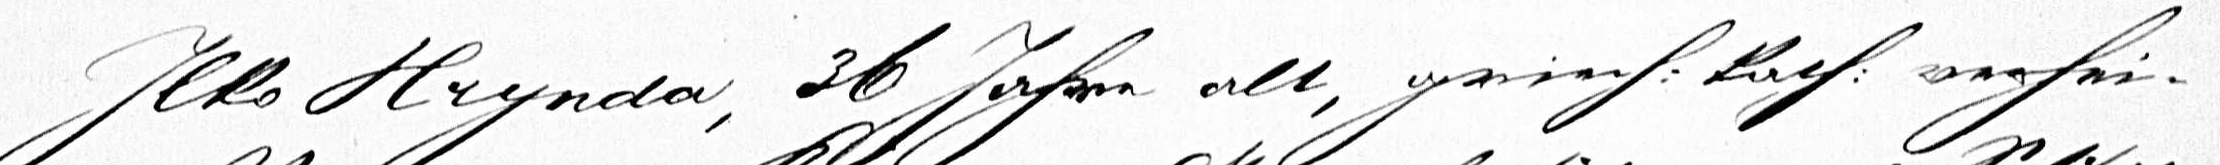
Jlko Hrynda, 36 Jahre alt, griech: kath: verhei¬
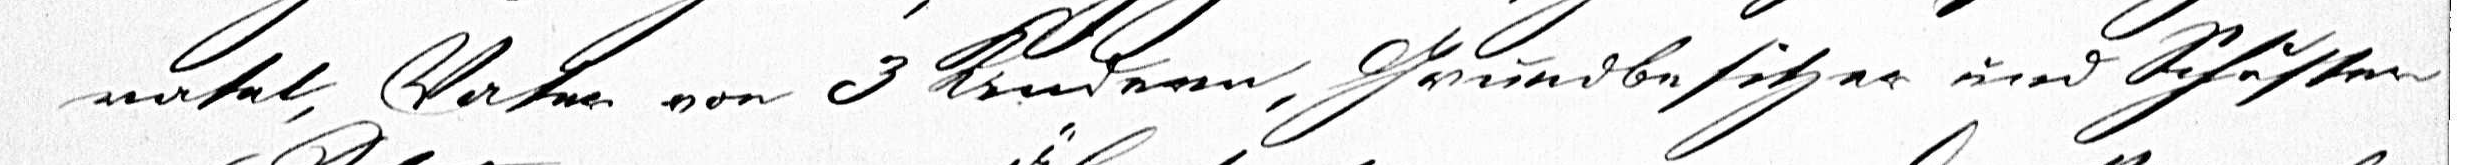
ratet, Vater von 3 Andern, Grundbesitzer und Schusten
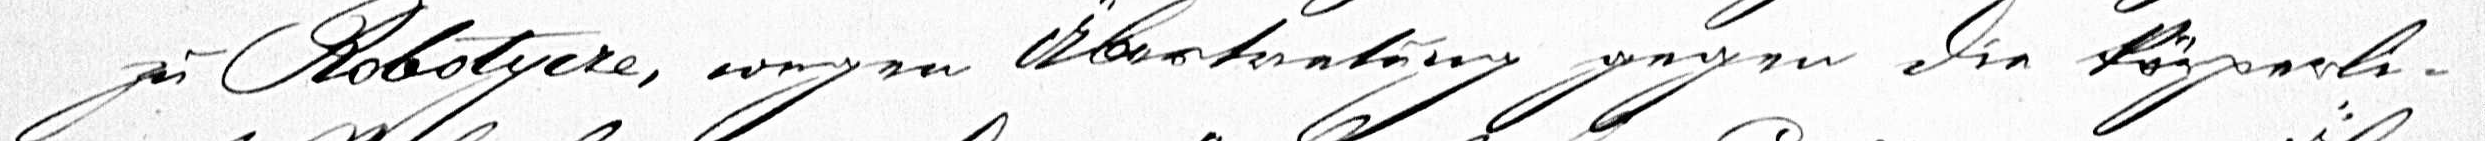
zu Robotycze, wegen Übertretung gegen die körperli¬
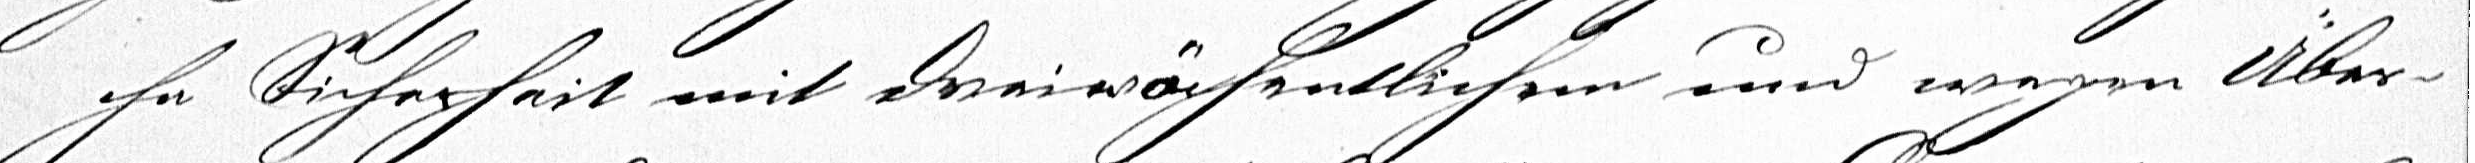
che Sicherheit mit dreiwöchentlichem und wegen Über¬
